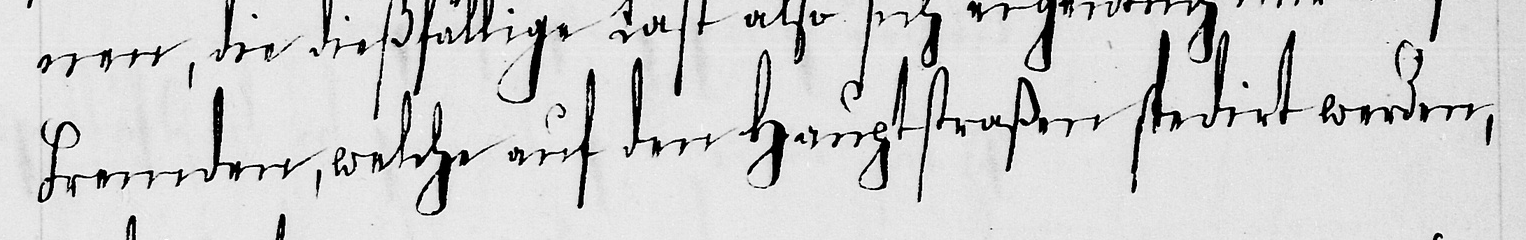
Fremden, welche auf den Hauptstraßen spedirt werden,
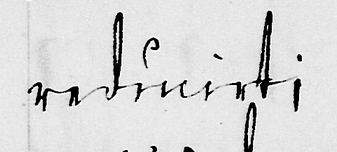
reducirt;
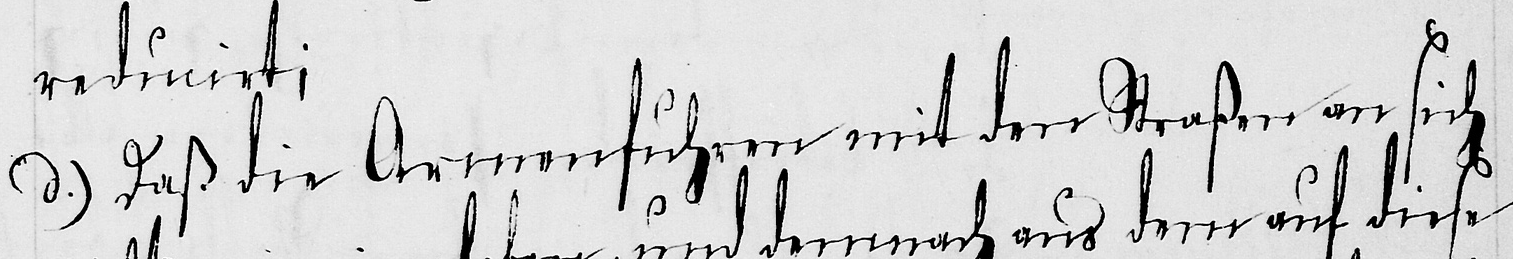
d.) Daß die Armenfuhren mit den Straßen an sich
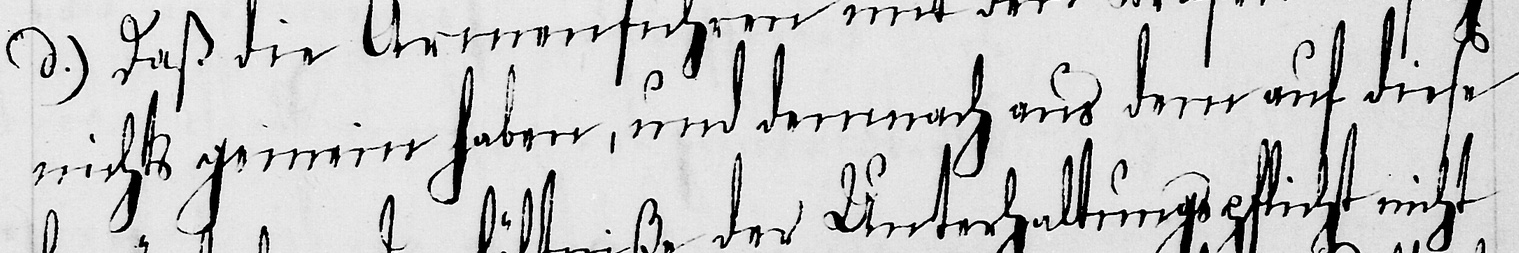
nichts gemein haben, und demnach aus dem auf diese
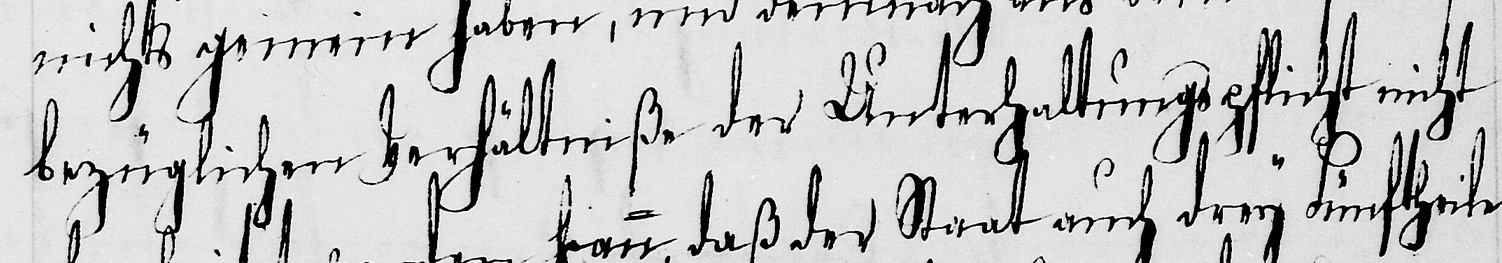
bezüglichen Verhältniße der Unterhaltungspflicht nic¬
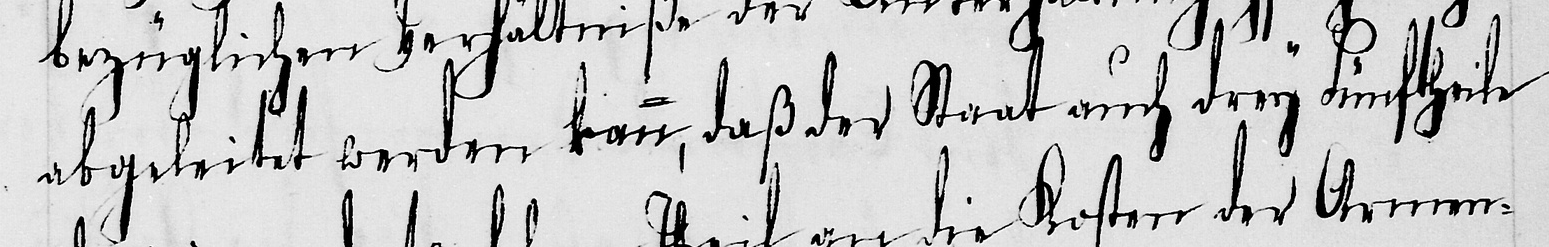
abgetheilt werden kann, daß der Staat auch drey Fünftheile
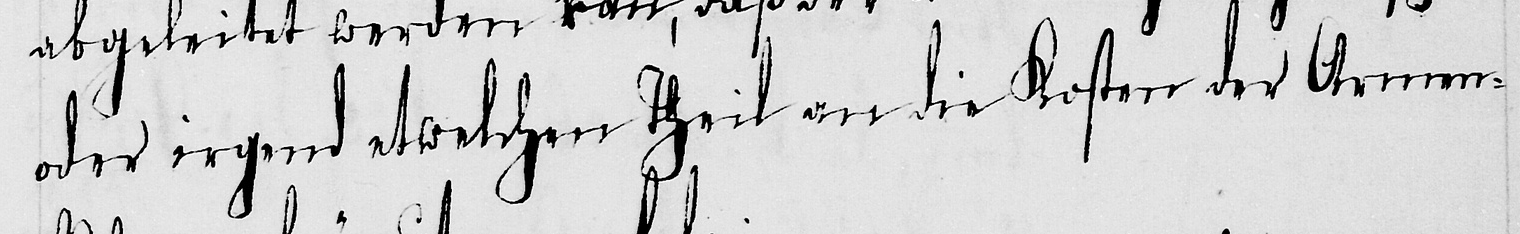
oder irgend etwelchen Theil an die Kosten der Armen¬
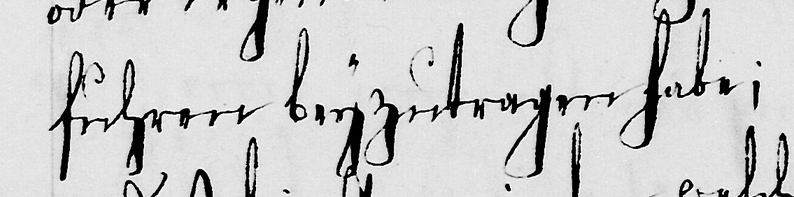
fuhren beyzutragen habe;
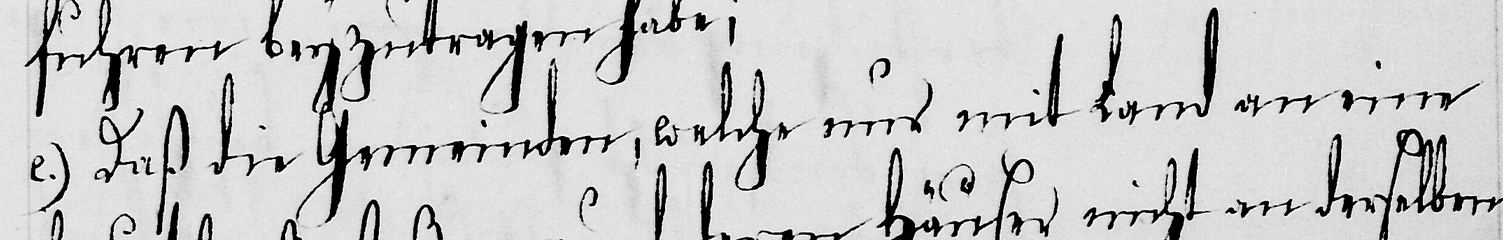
e.) Daß die Gemeinden, welche nur mit Land an eine
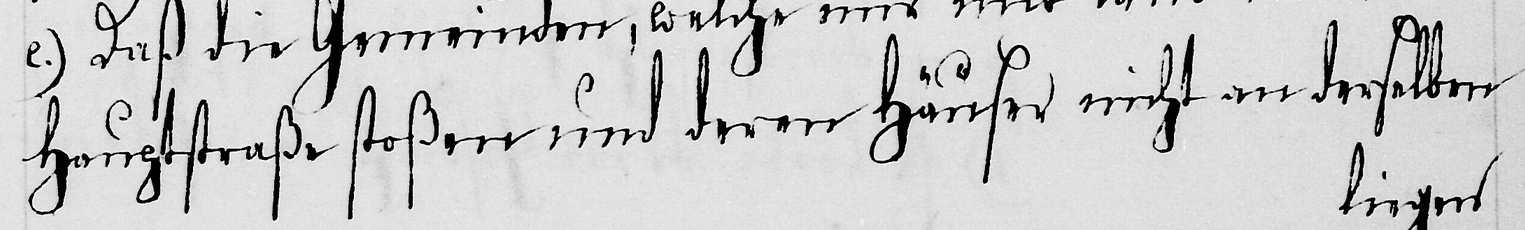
Hauptstraße stoßen und deren Häuser nicht an derselben
